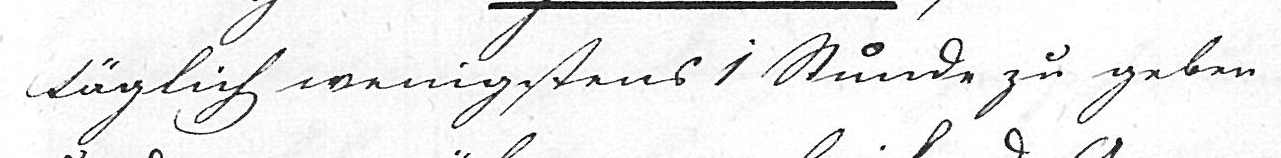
täglich wenigstens 1 Stunde zu geben
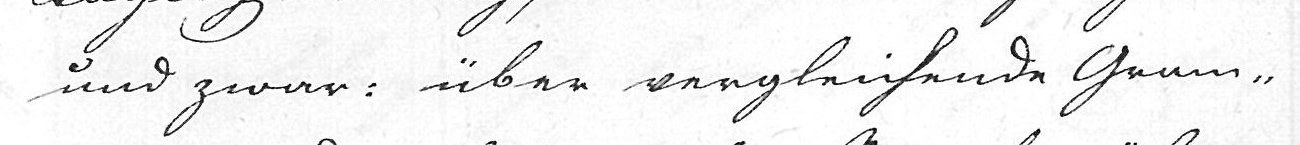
und zwar: über vergleichenden Gram-
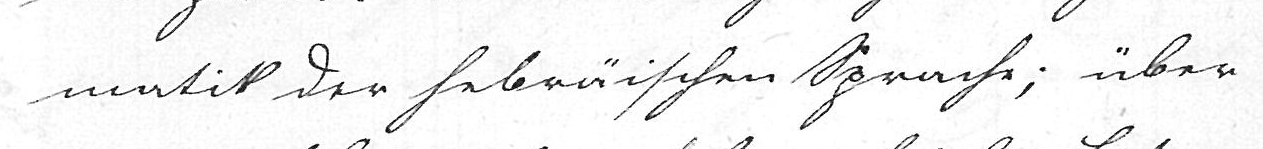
matik der hebräischen Sprache; über
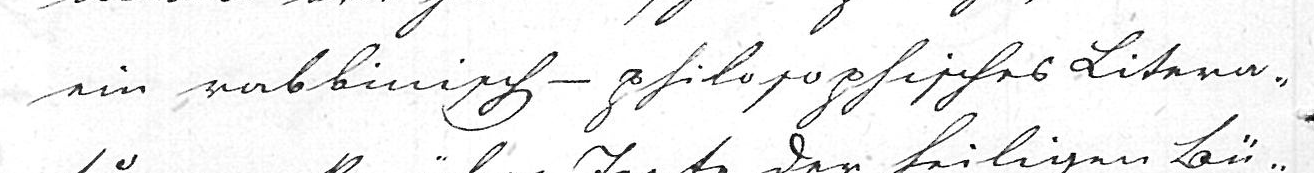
ein rabbinisch-philosophisches Litera-
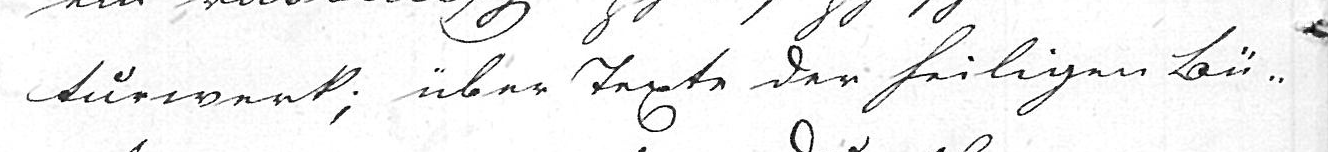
turwerk; über Texte der heiligen Bü-
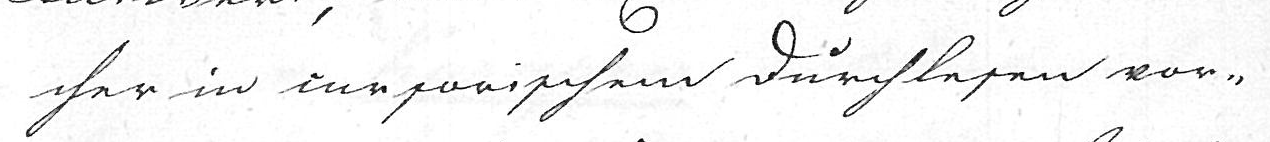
cher in cursorischem Durchlesen vor-
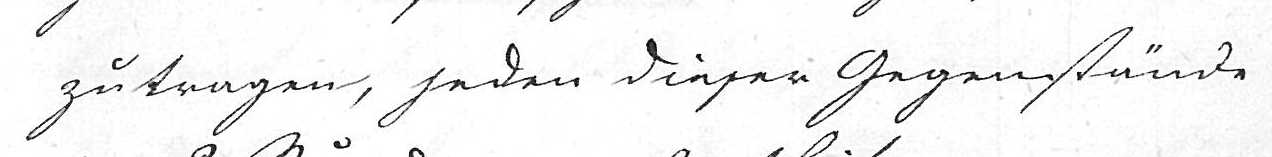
zutragen, jeden dieser Gegenstände
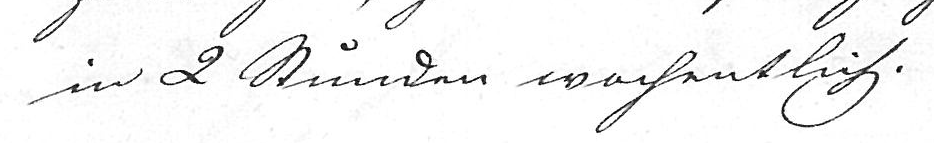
in 2 Stunden wochentlich.
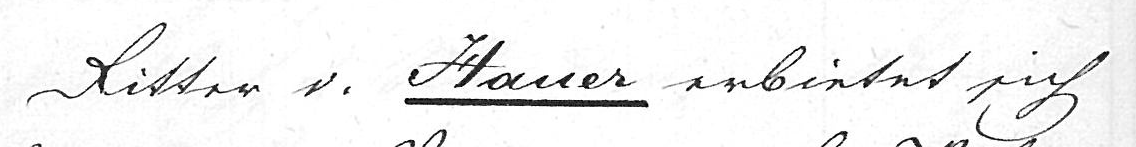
Ritter v. Hauer erbietet sich
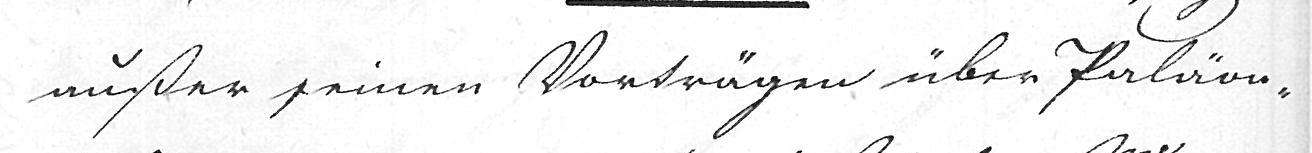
außer seinen Vorträgen über Paläon-
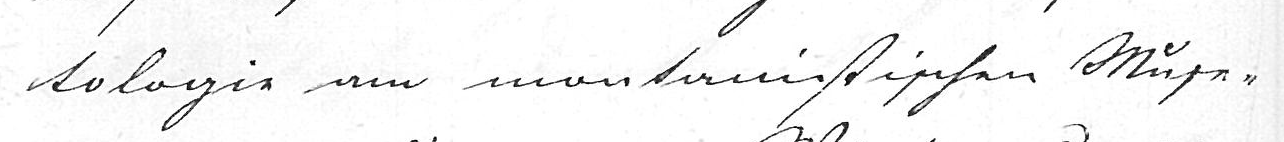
tologie am montanistischen Muse-
